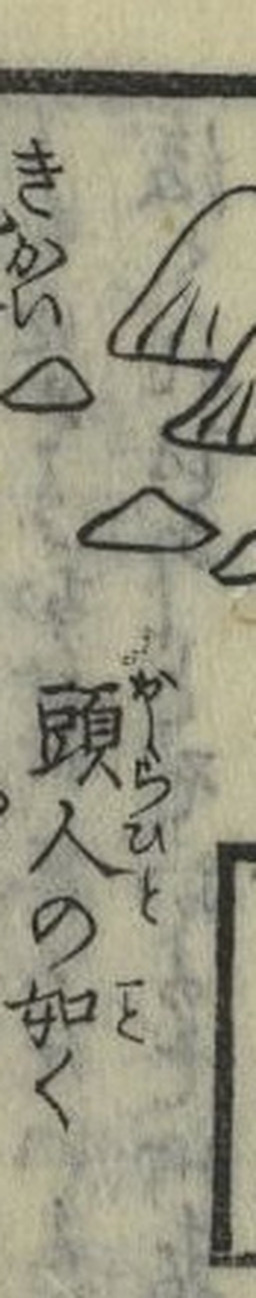頭人の如く
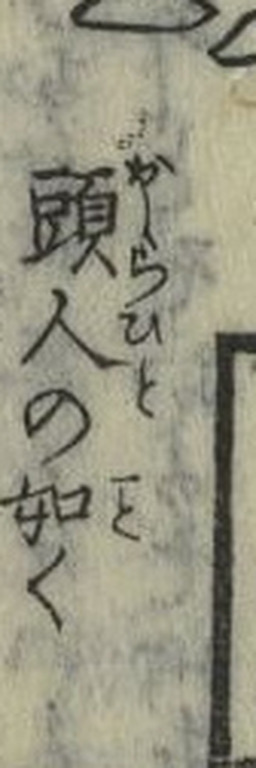頭人の如く
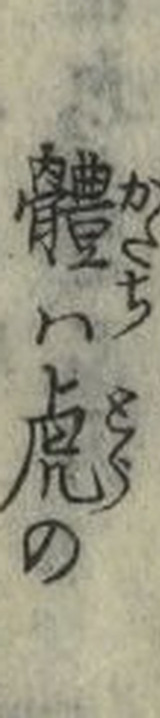体は虎の
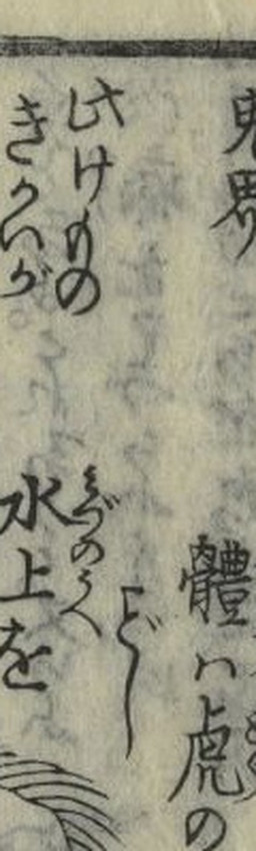此けもの
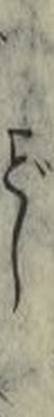ごとし
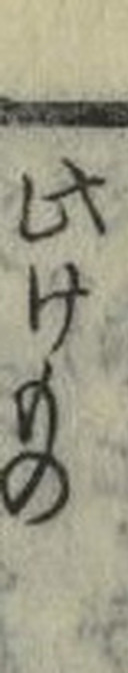此けもの
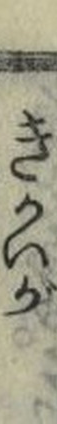きかいが
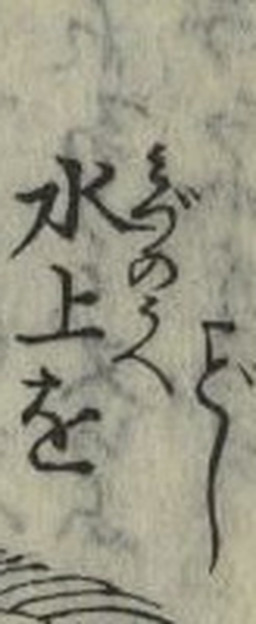水上を
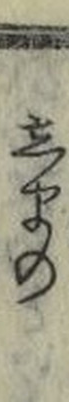しまの
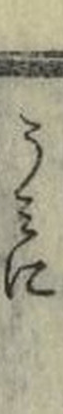うみに
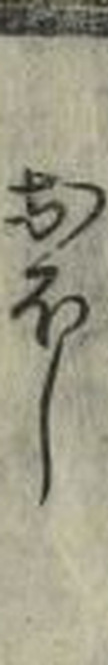おほし
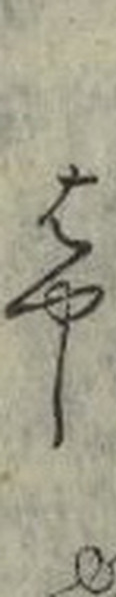はやし
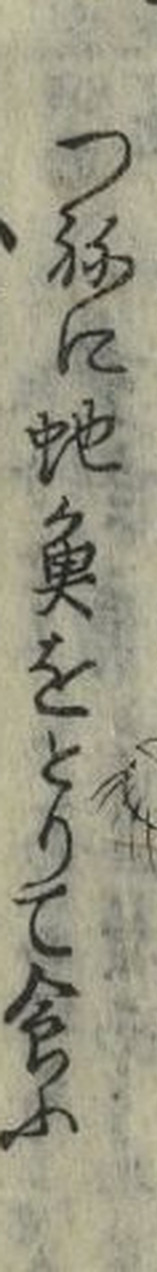つねに地魚をとりて食ふ
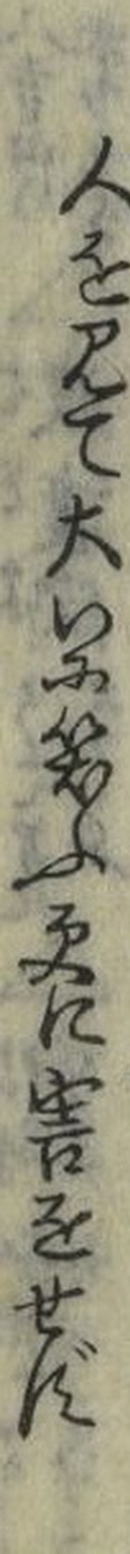人を見て大いに笑ふ更に害をせず

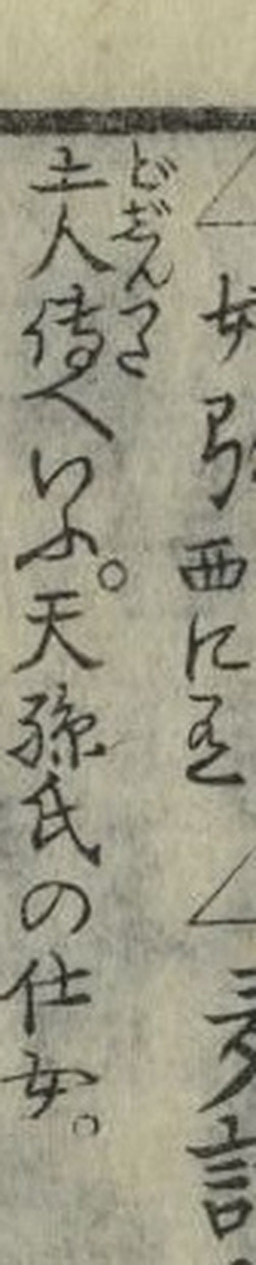土人伝へいふ。天孫氏の仕女。
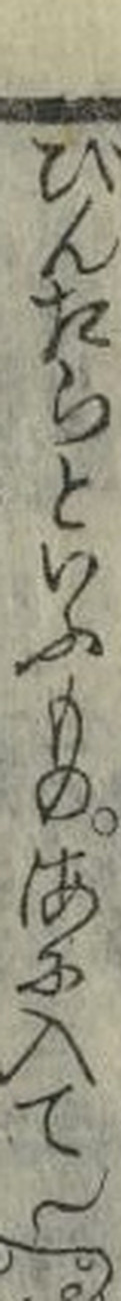びんたらといふもの。海に入て
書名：琉球奇譚
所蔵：University of the Ryukyus Library
